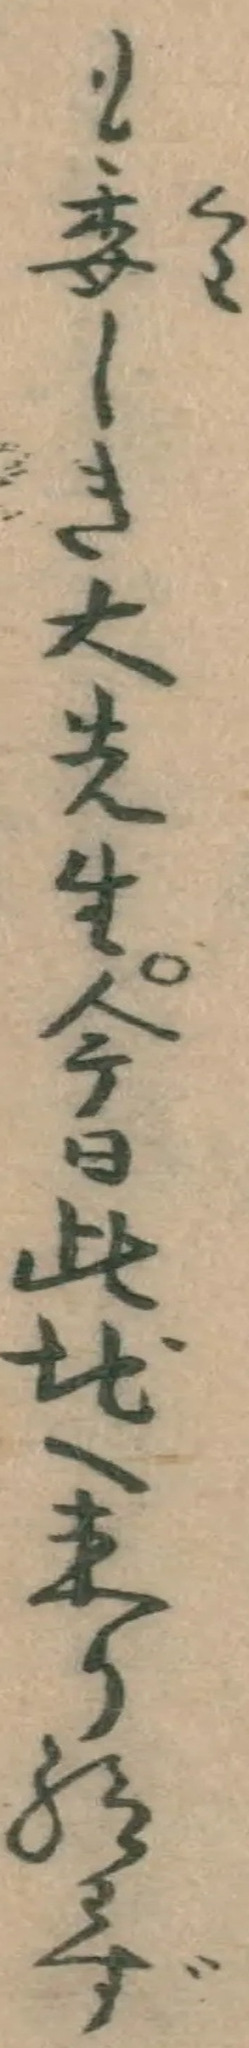も委しき大先生。今日此地へ来り給わず
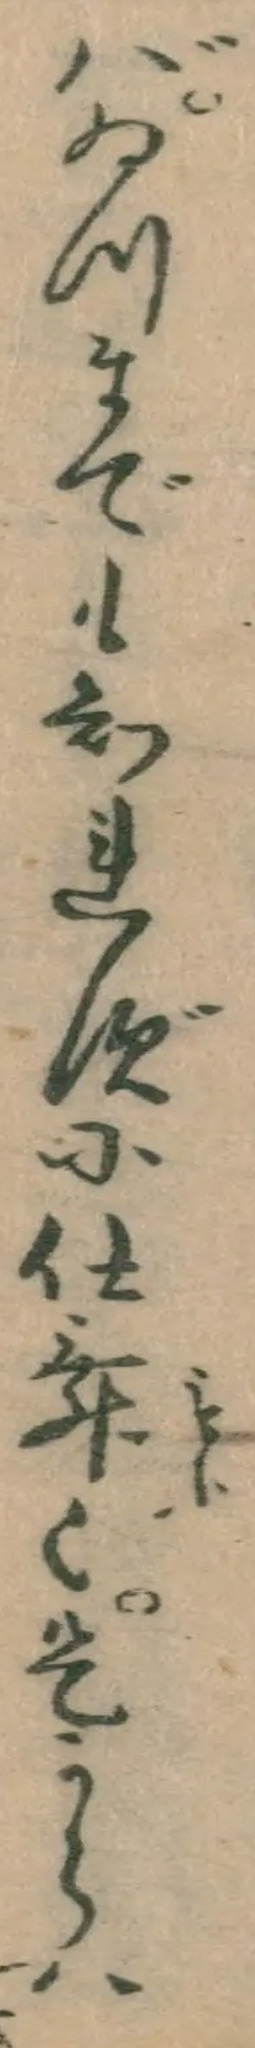ば。ゐつまでも知れずに仕舞也。是からは
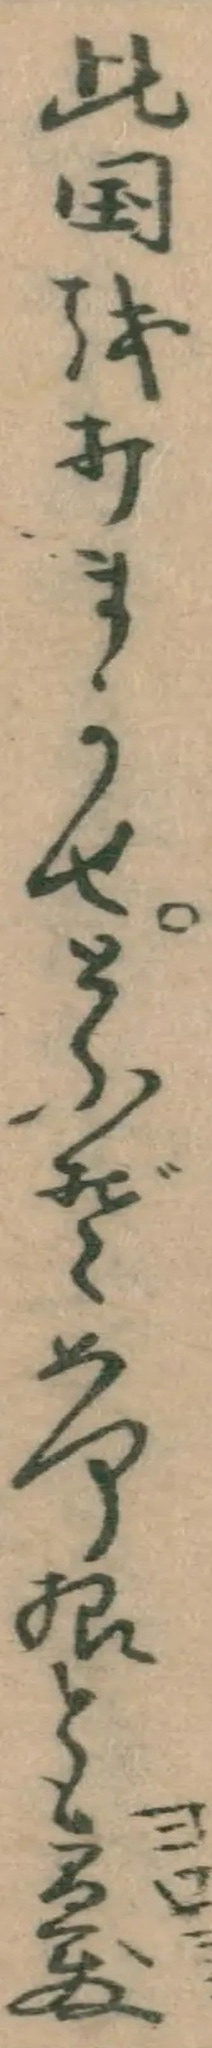此国を打まかせ。とふぞ如何様とも宜敷
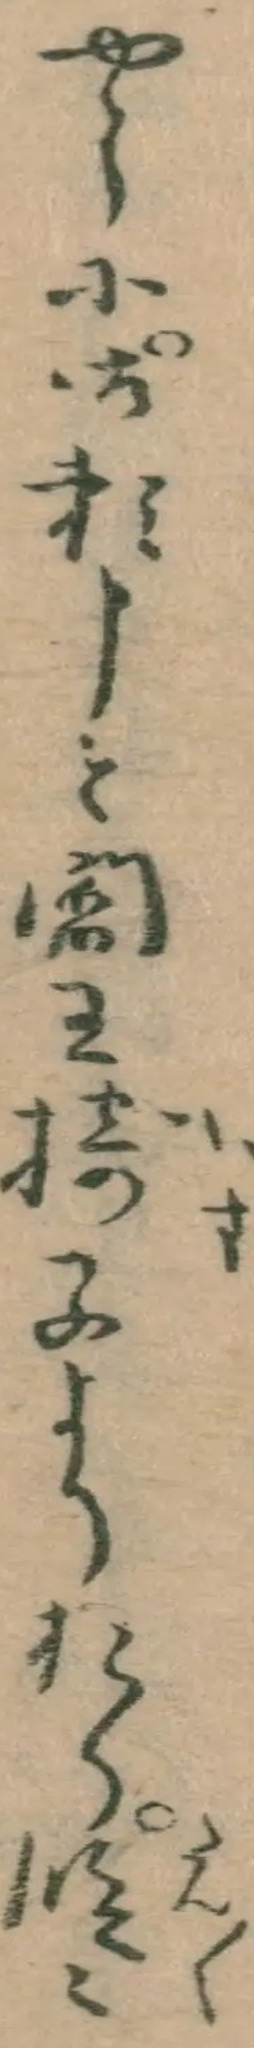やうに。御頼申と閻王椅子よりおり。段々
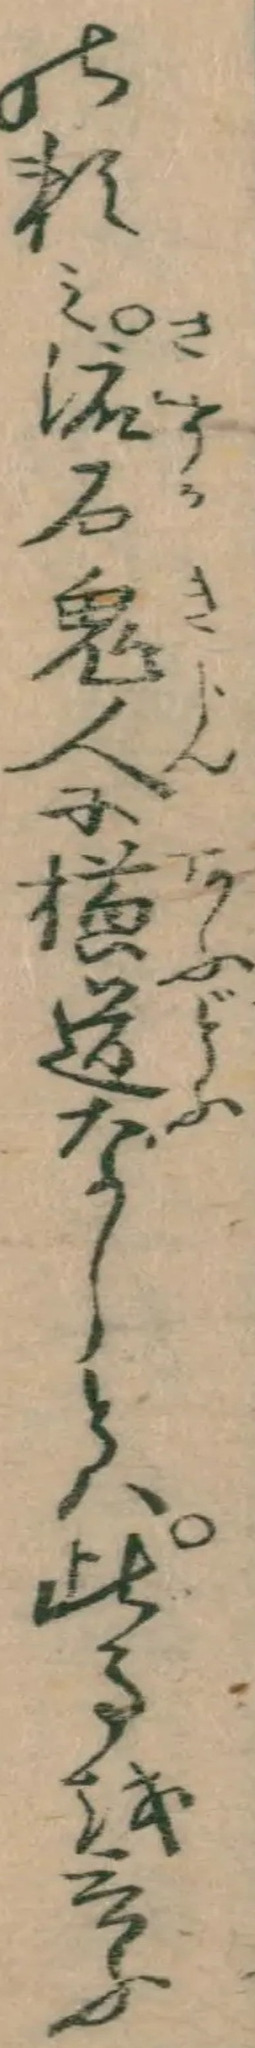の頼み。流石鬼人に横道なしとは。此事を言ふ
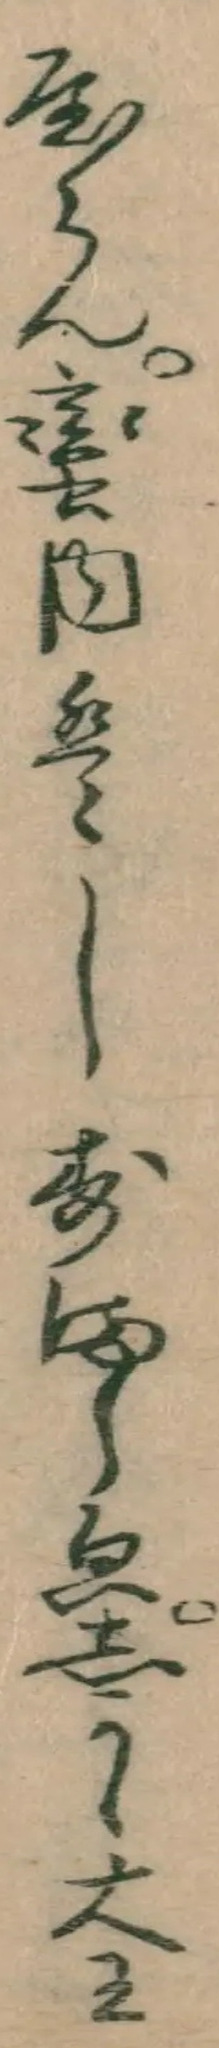やらん。蛮内はしすまし㒵。しかし大王
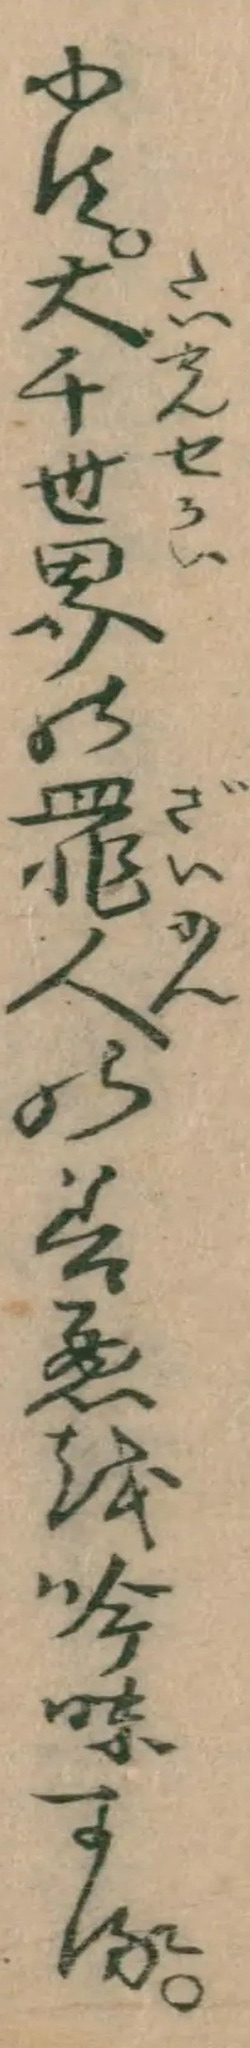には。大千世界の罪人の善悪を吟味する。
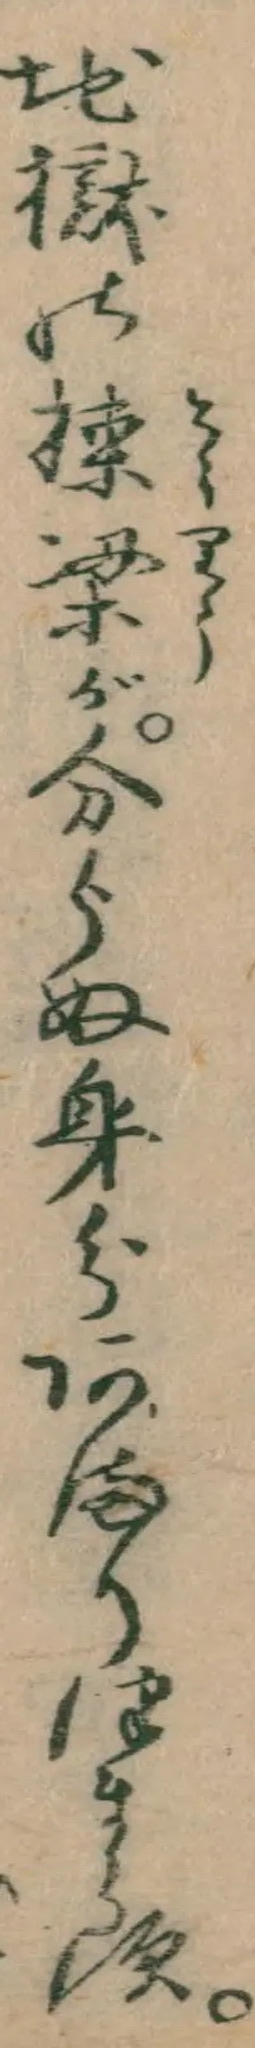地獄の棟梁が。分らぬ身分あまりつまらす。
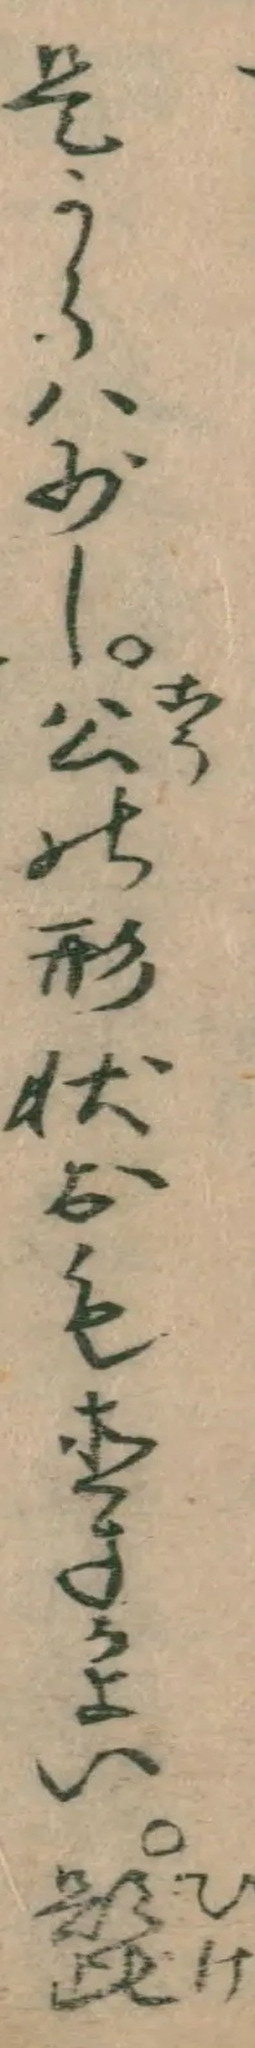是からは少し。公の形状おも直すかよい。髭
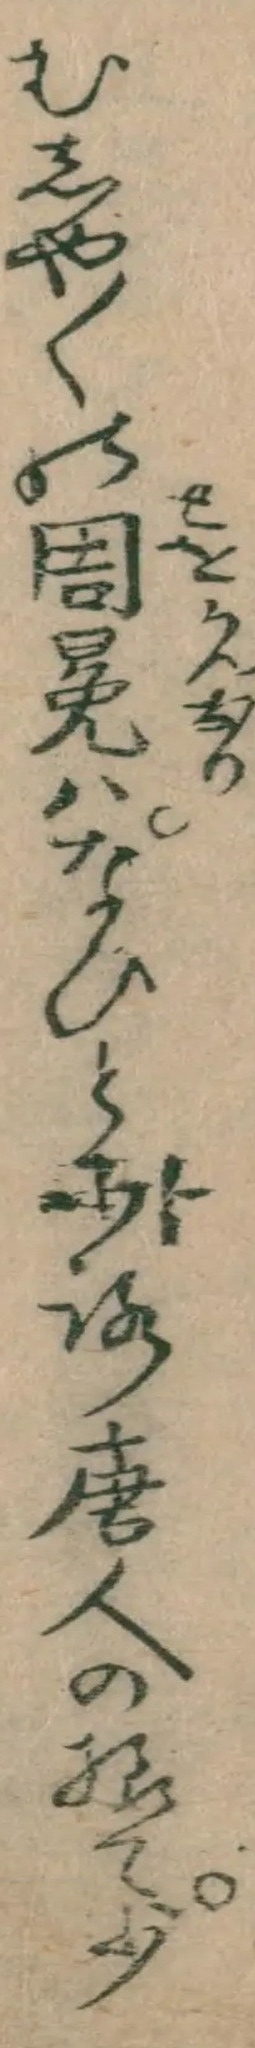むしや〳〵の周冕は。なひとろ唐人の様て。少
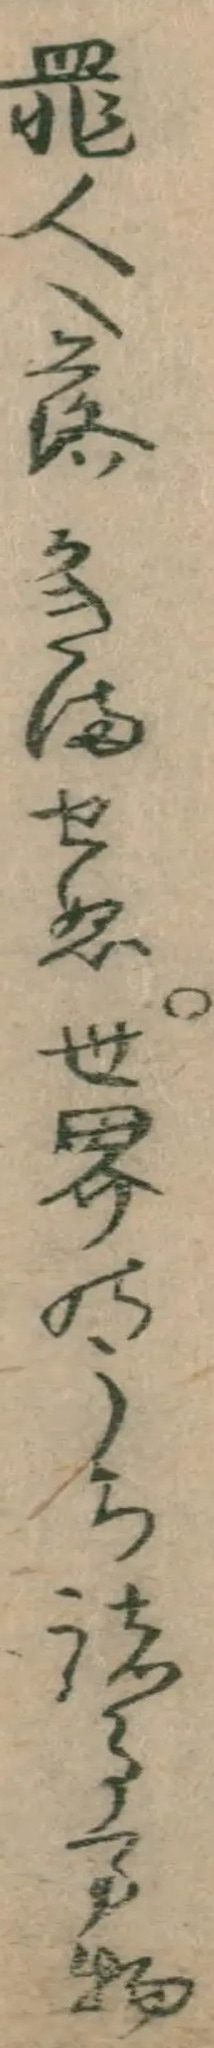罪人へ落かきませぬ。世界のうち諸事万物
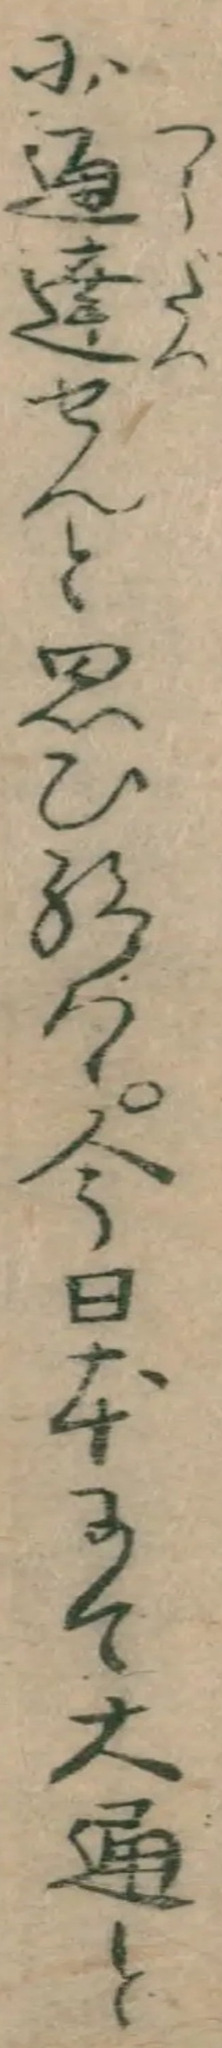に通達せんと思ひ給はゝ。今日本にて大通と

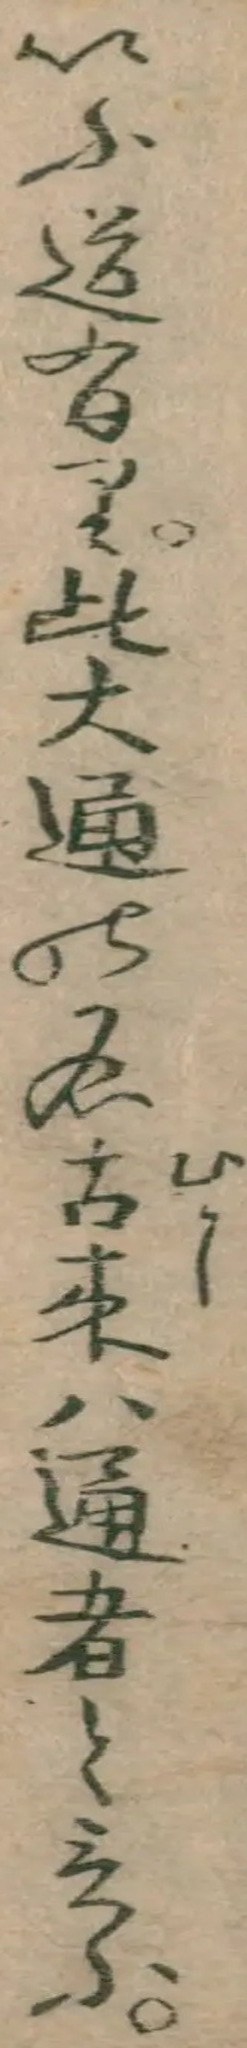いふ道有り。此大通の名古来は通者と言う。
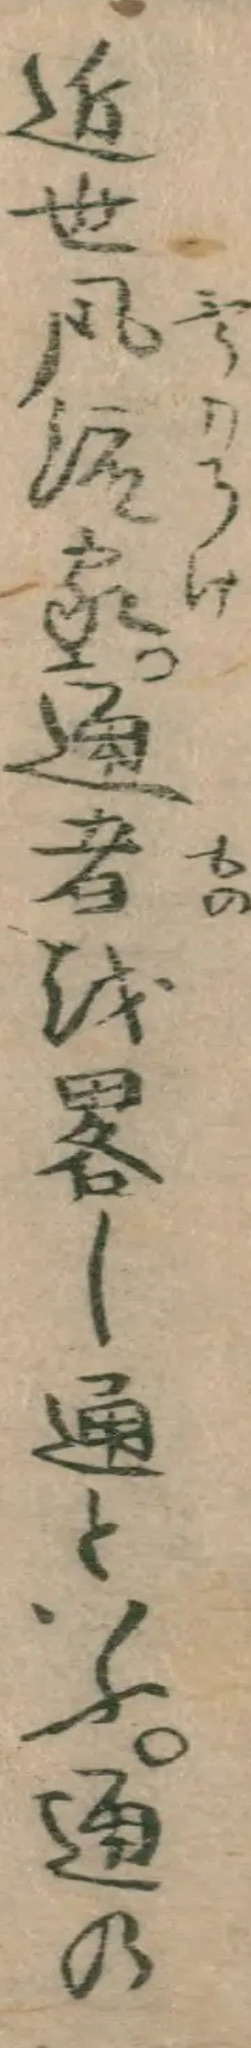近世風流家。通者を略し通といふ。通の
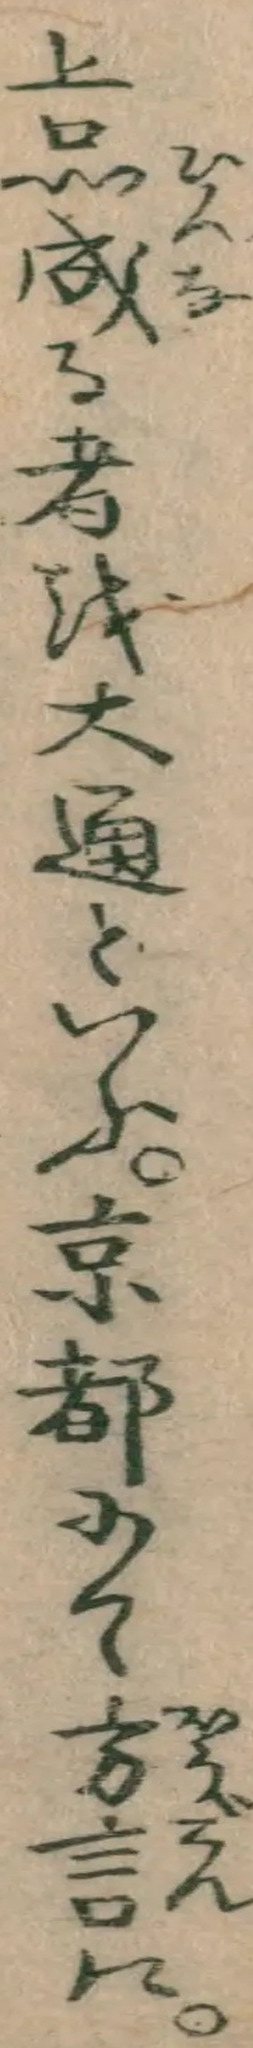上品成る者を大通といふ。京都にて方言に。
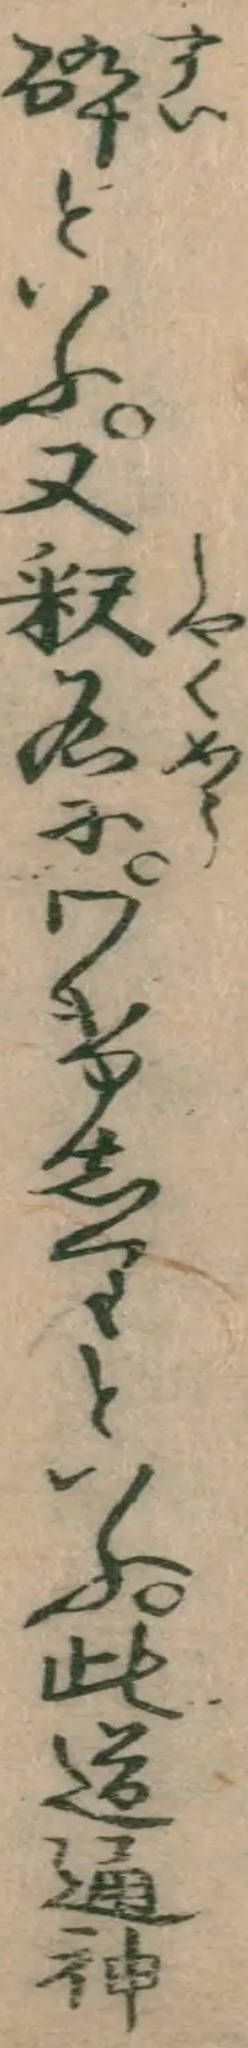粋といふ。又釈名に。わけしりといふ。此道通神
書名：翻草盲目
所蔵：国立国会図書館 National Diet Library, JAPAN
